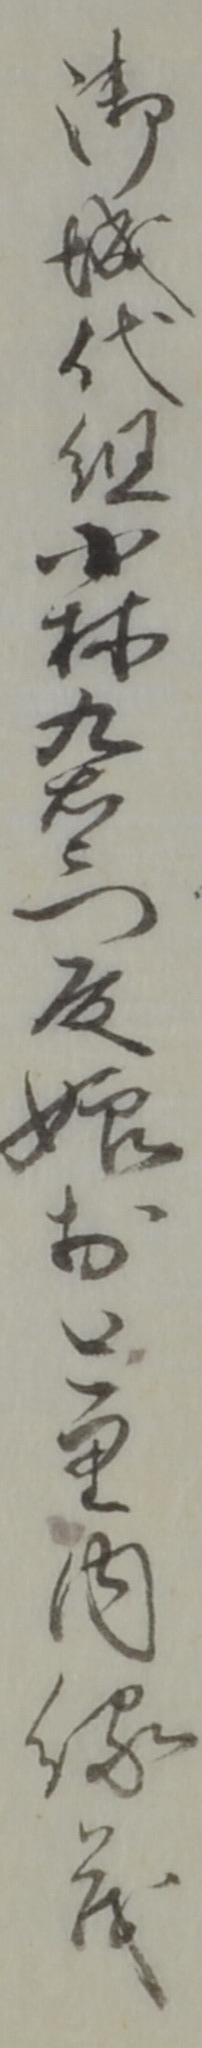御城代組小林九右衛門殿娘お兼内縁も
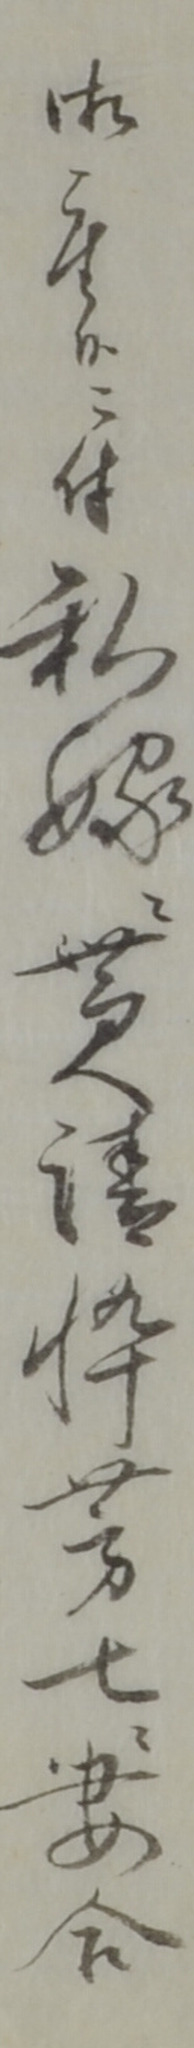御座候ニ付私嫁ニ貰請忰芳七ニ妻合
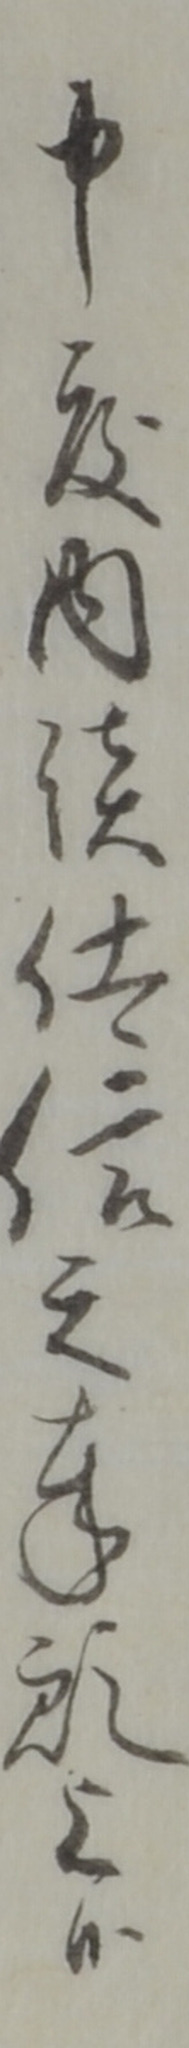申度内談仕依之奉願上候
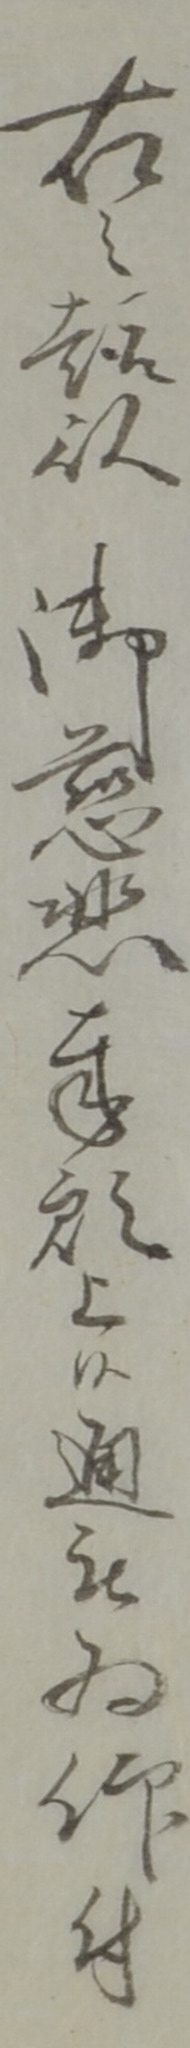右之趣以御慈悲奉願上候通被為仰付
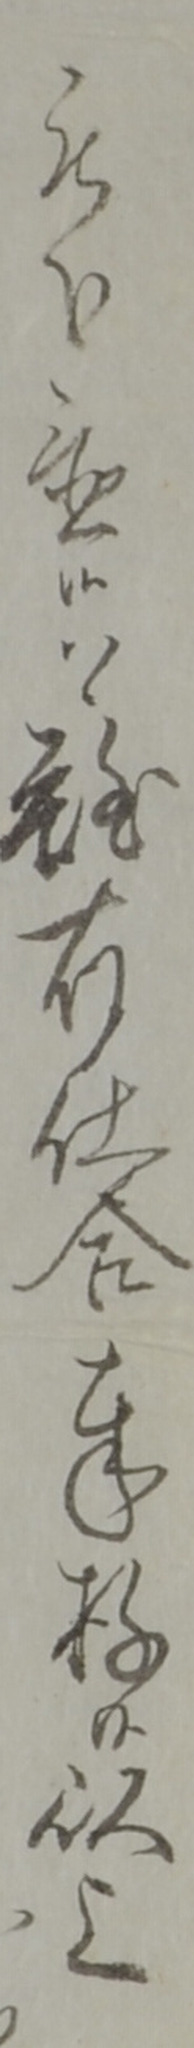被下置候ハヽ難有仕合奉存候以上
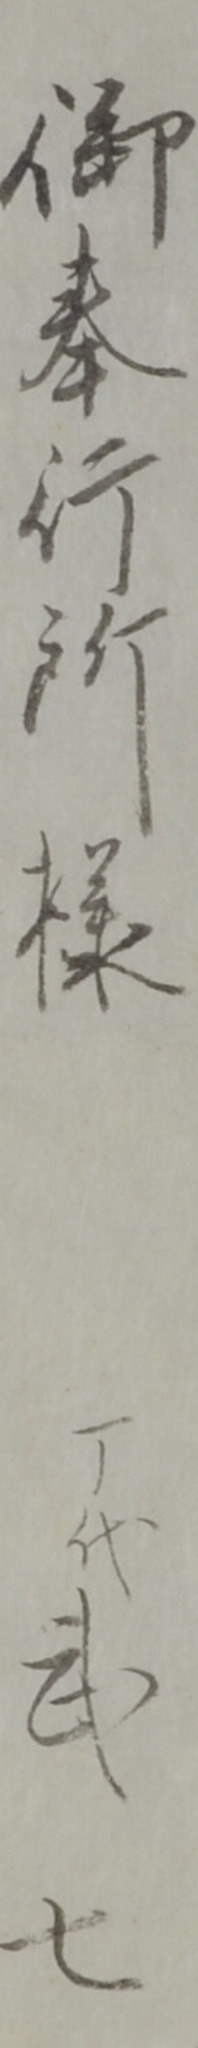御奉行所様丁代武七

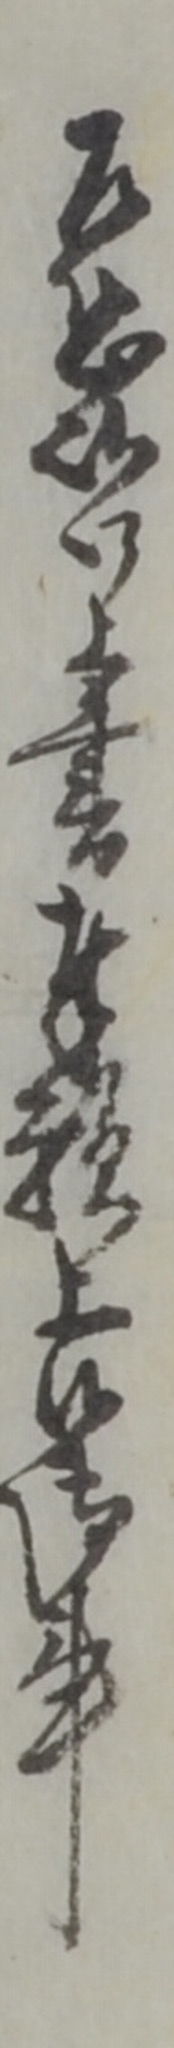乍恐以口上書奉願上候御事
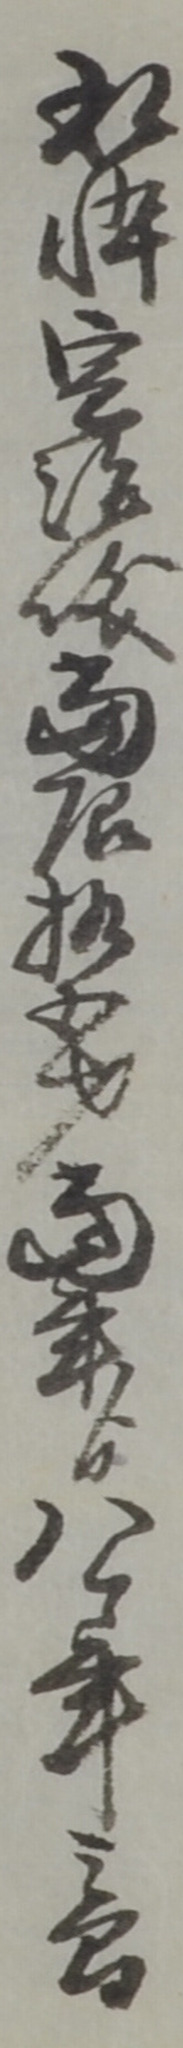私忰定治儀当辰拾五才当年ゟ八ヶ年之間
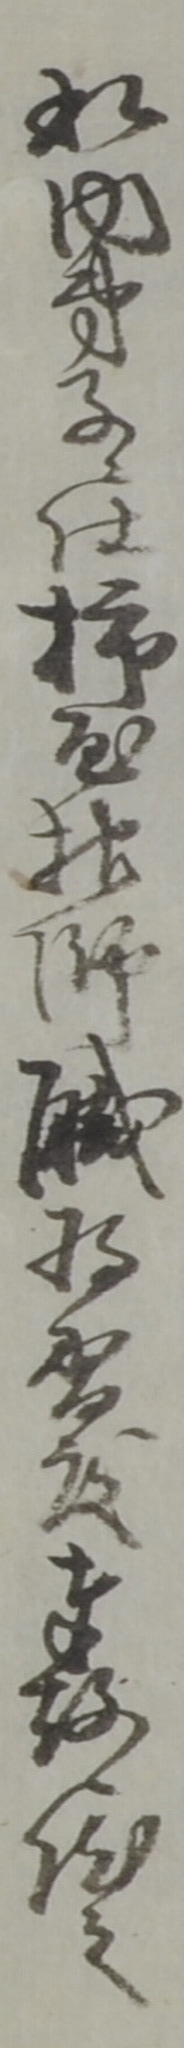私内弟子ニ仕柿屋様師職為習度奉存候依之
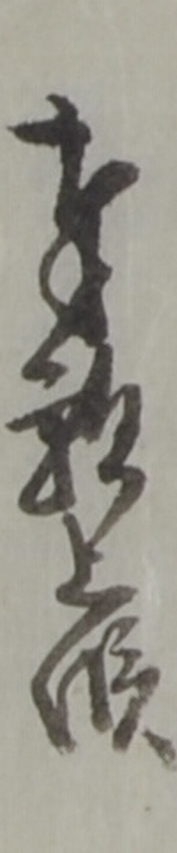奉願上候
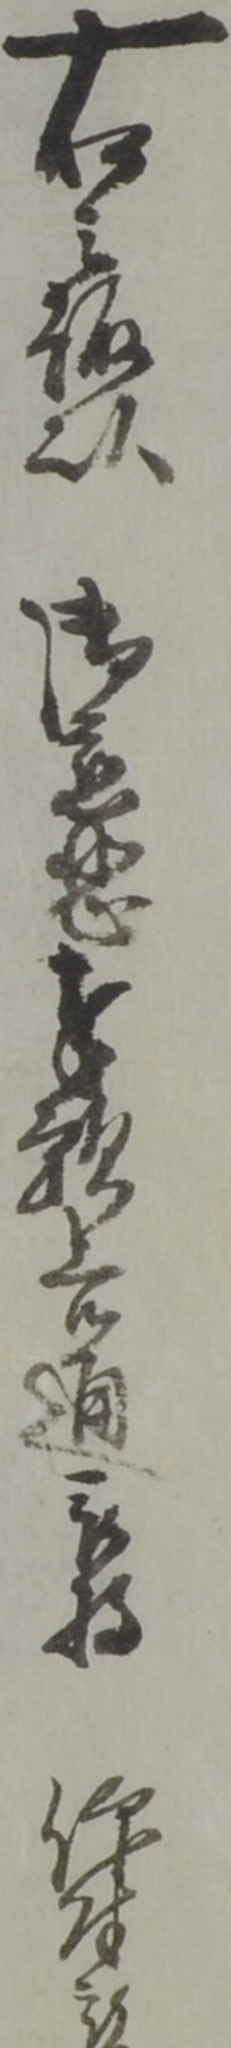右之趣以御慈悲奉願上候通被為仰付被下
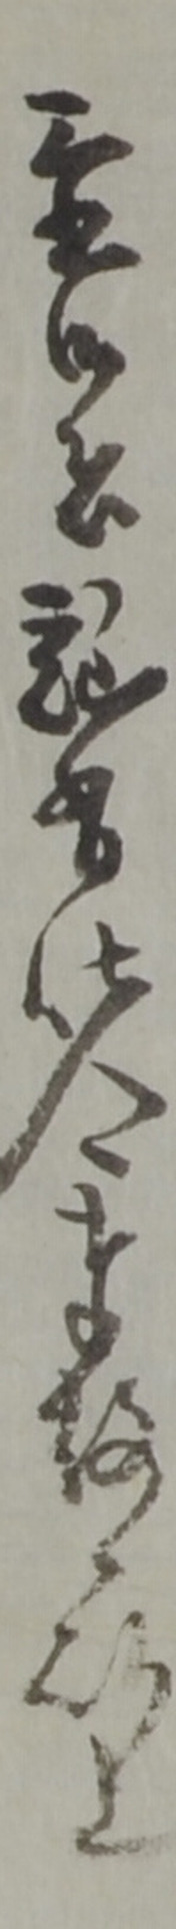置候者難有仕合奉存候以上
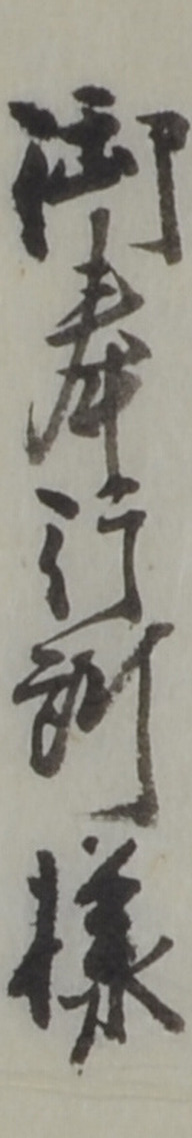御奉行所様
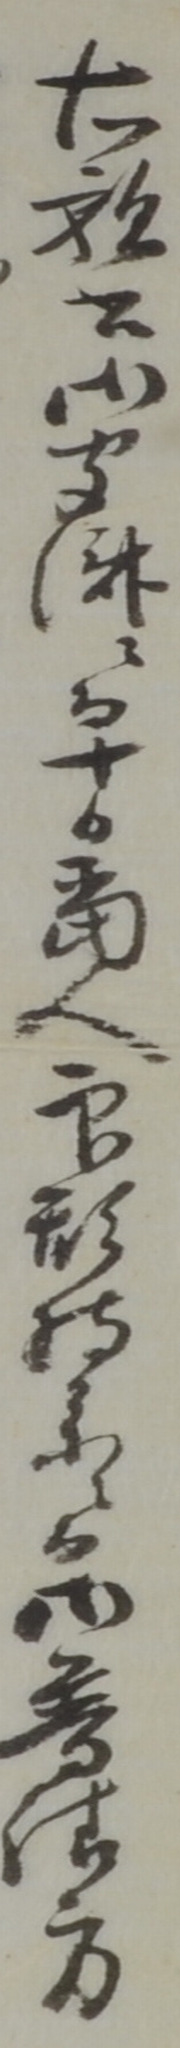右願書御聞済ニ而十日当人印形持参ニ而御普請方
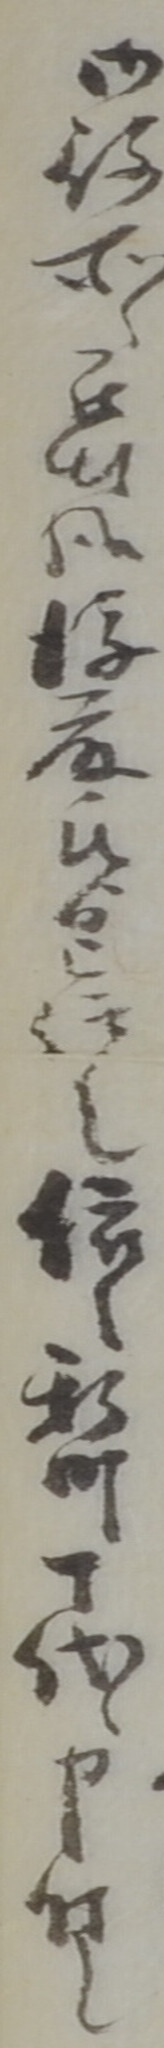御役所罷出後藤氏ゟ被伝申候依之新町丁代へ申付候
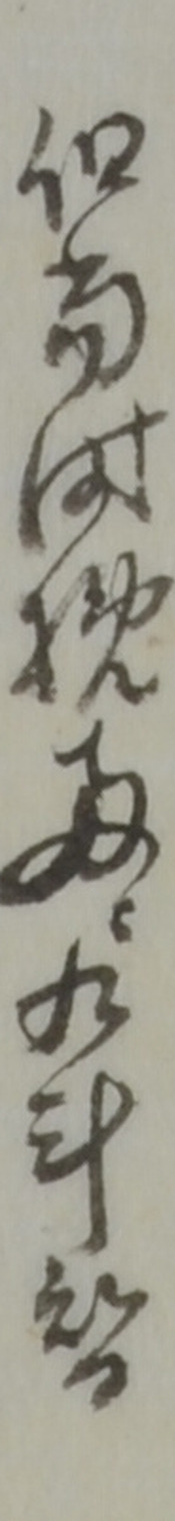但当時挽両ニ九斗替
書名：諸願書控簿
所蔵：伊那市立高遠町図書館・合同会社AMANE
